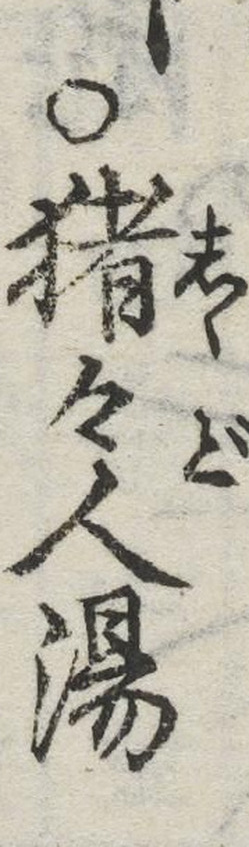〇猪々人湯
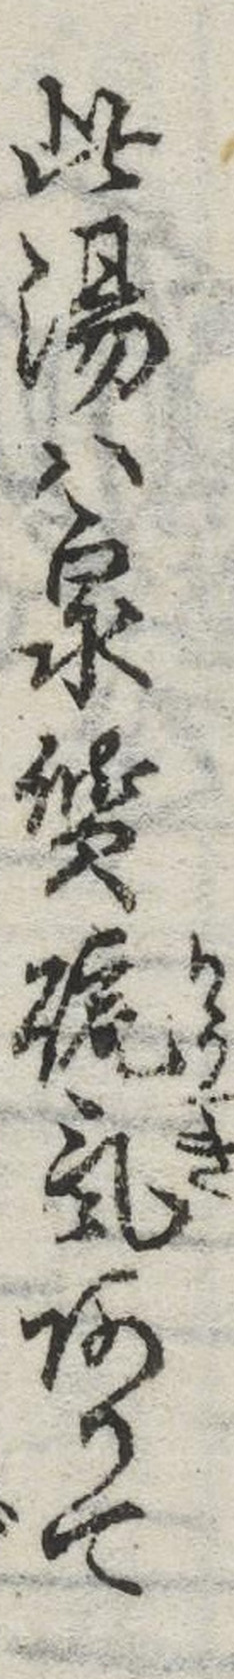此湯は泉質硫気ありて
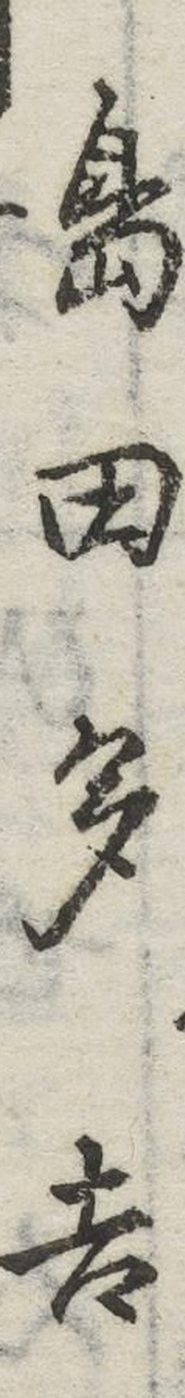島田多吉
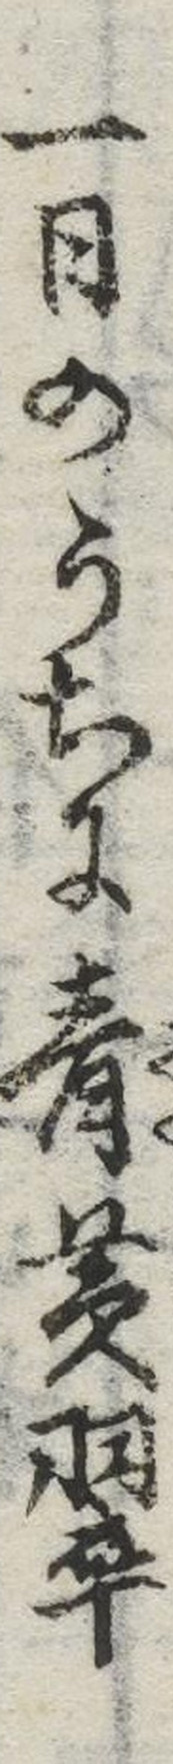一日のうちに青黄翠
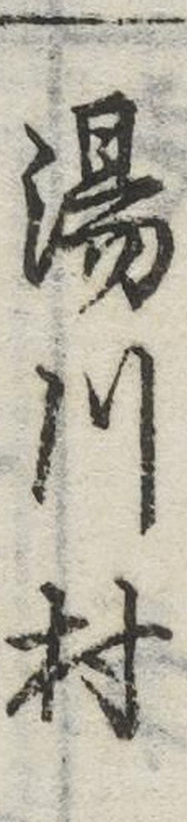湯川村
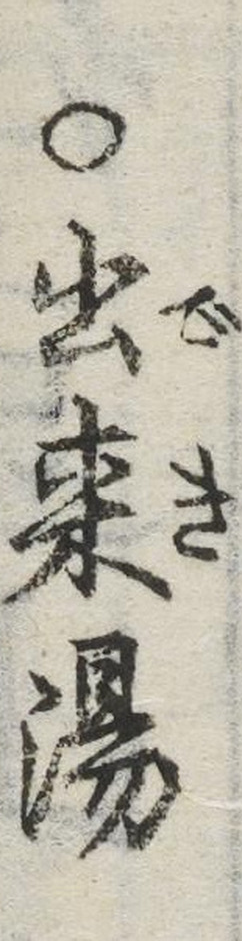〇出来湯
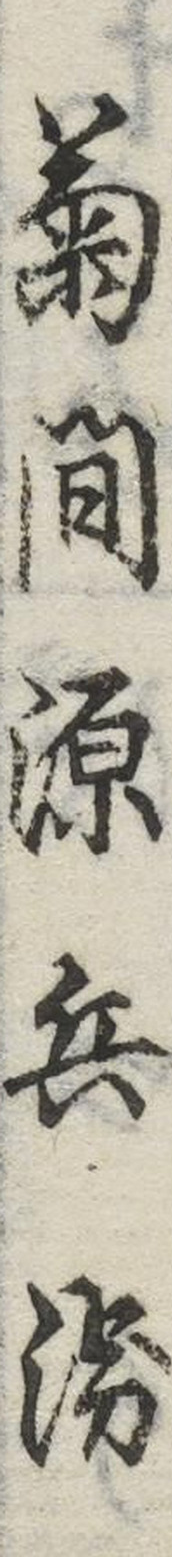菊間源兵衛
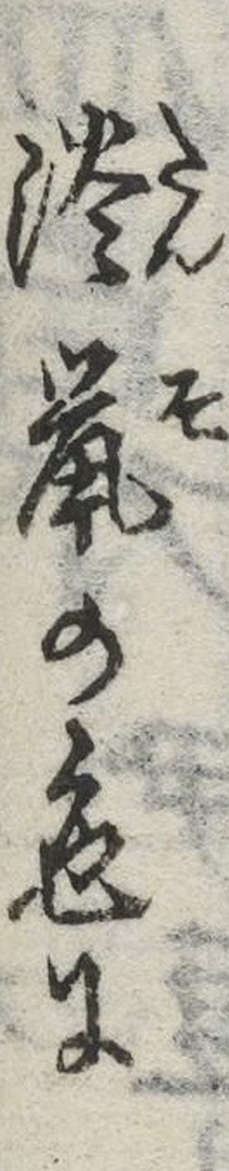淡鼡の色に
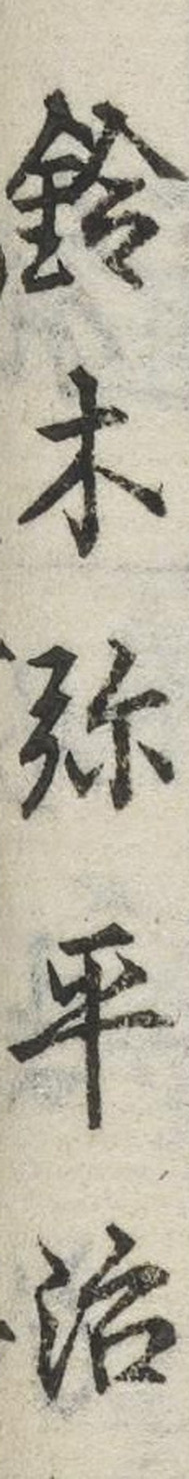鈴木弥平治
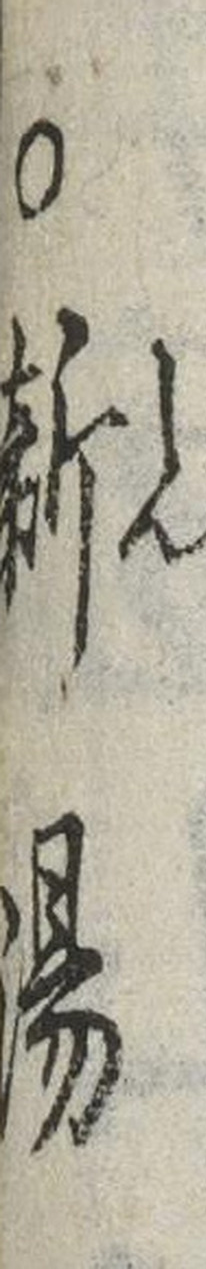〇新湯
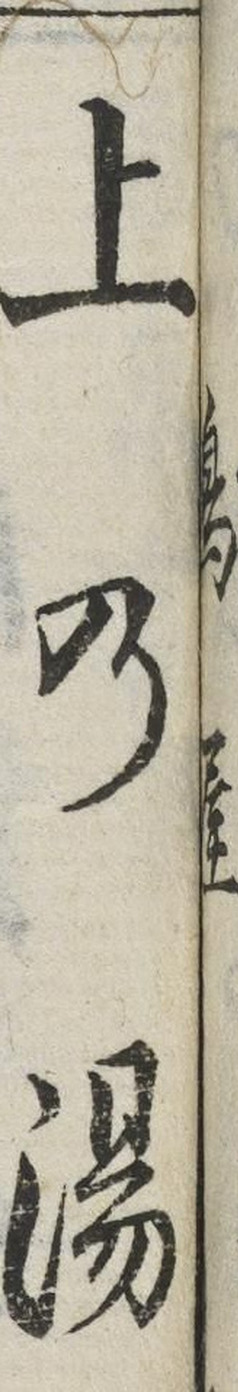上の湯
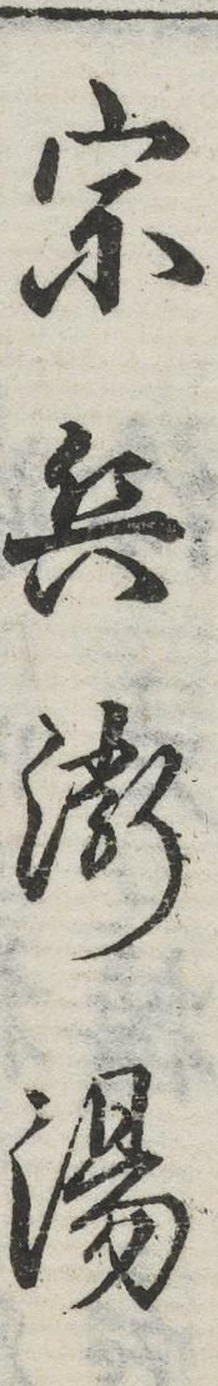宗兵衛湯
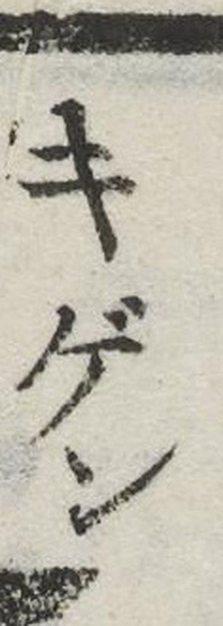キゲン
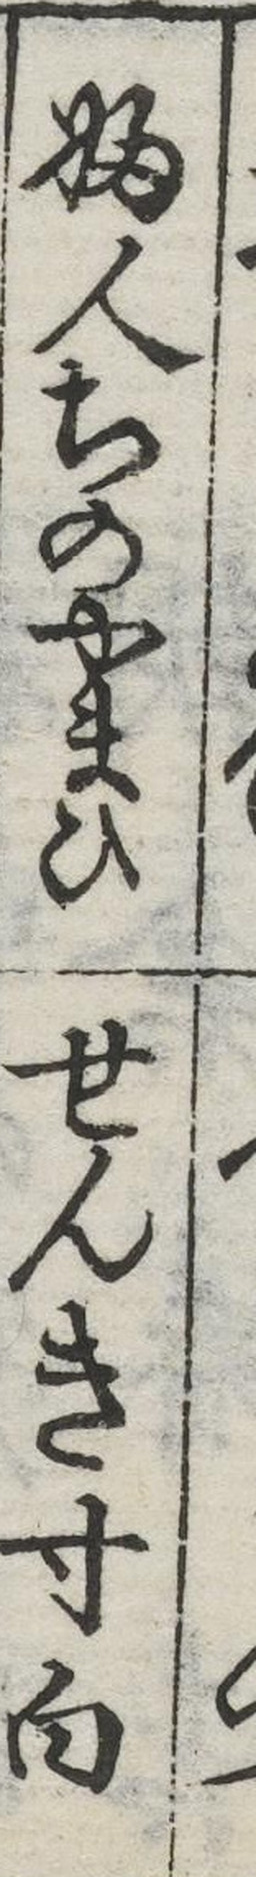婦人ちのやまひせんき寸白
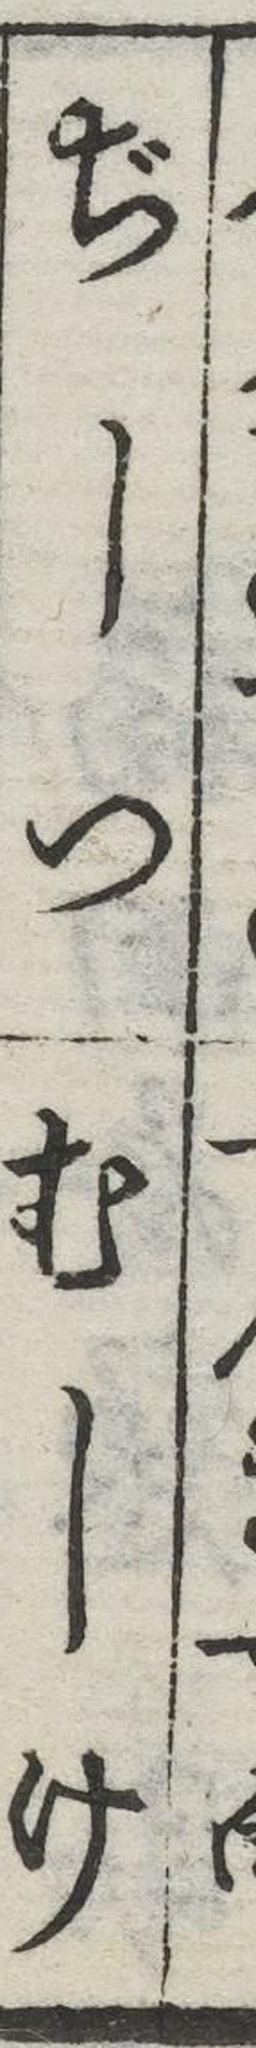ぢしつむしけ
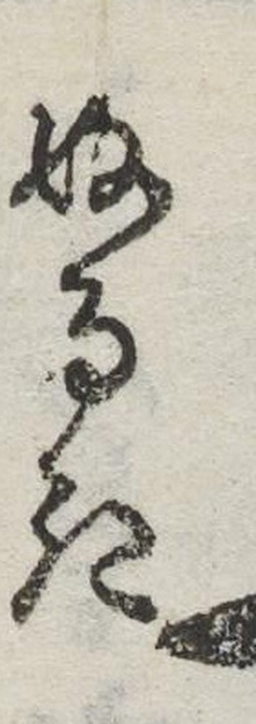ぬるき
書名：諸國温泉遊覽記　全
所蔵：東京大学地震研究所図書室 Earthquake Research Institute Library, The University of Tokyo, JAPAN
